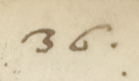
36.
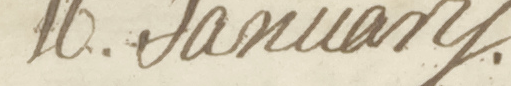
16. January.
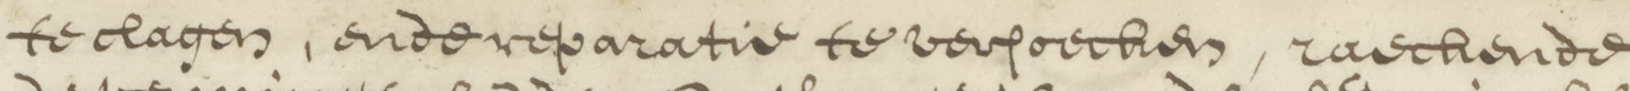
te clagen, ende reparatie te versoecken, raeckende
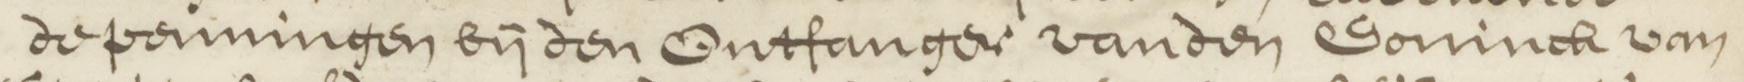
de penningen bij den Ontfanger vanden Coninck van
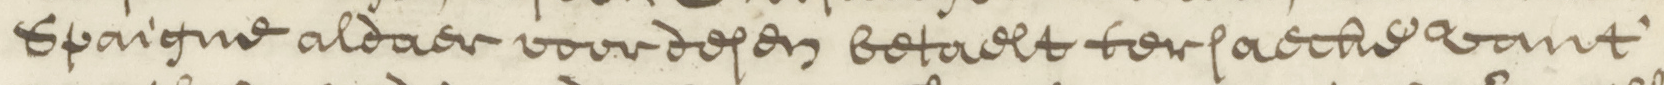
Spaigne aldaer voor desen betaelt ter saecke vant'
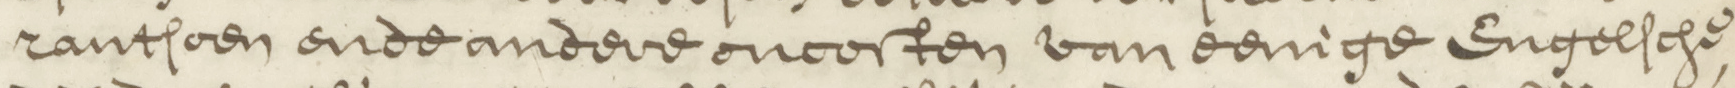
rantsoen ende andere oncosten van eenige Engelsche,
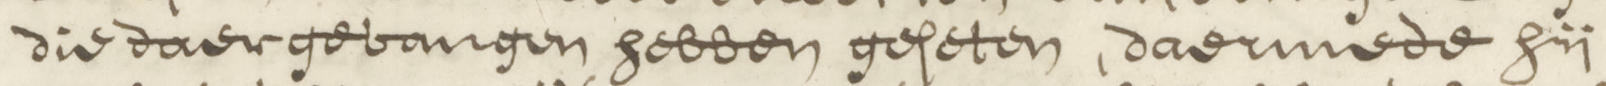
die daer gevangen hebben geseten, daermede hij
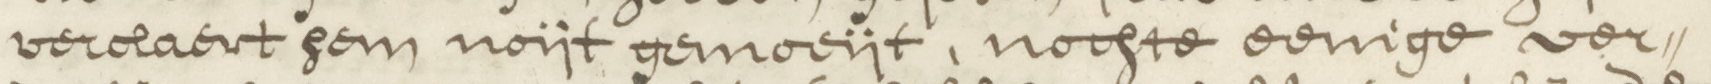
verclaert hem noijt gemoeijt, nochte eenige ver„
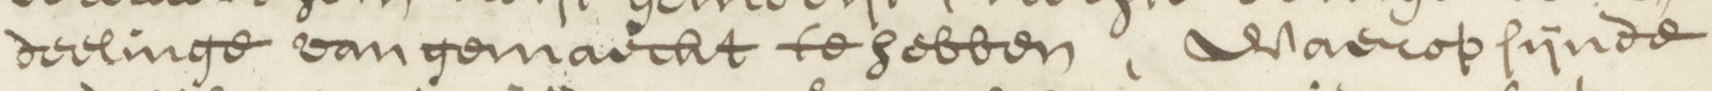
deelinge van gemaeckt te hebben. Waerop sijnde
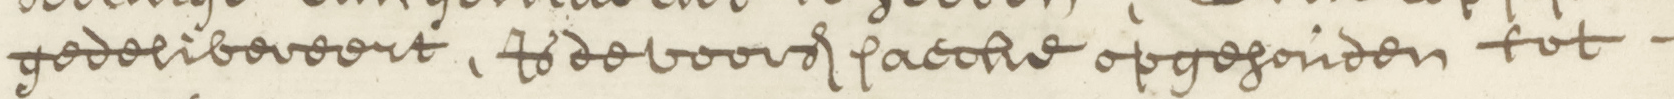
gedelibereert, Is de voors saecke opgehouden tot
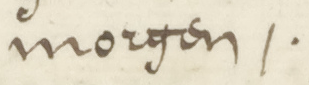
morgen.
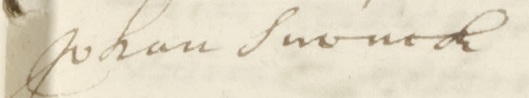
Johan Snouck
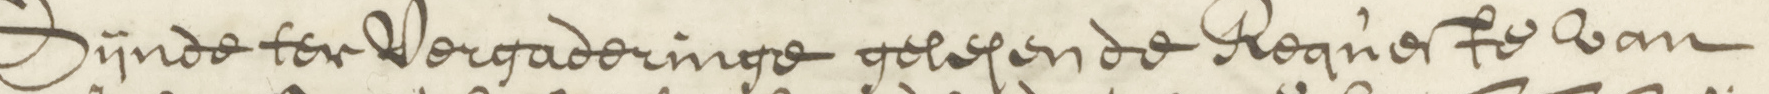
Sijnde ter Vergaderinge gelesen de Requeste van
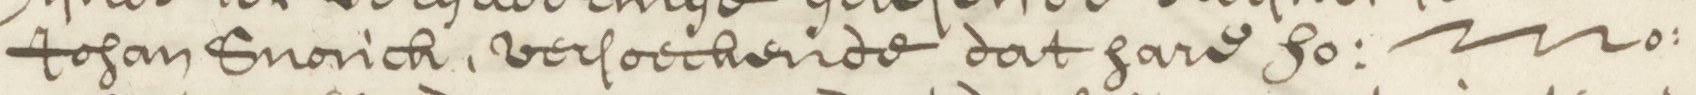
Johan Snouck, versoeckende dat hare Ho:Mo:
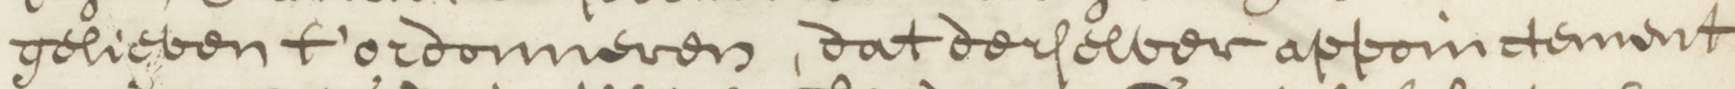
gelieven t'ordonneren, dat derselver appoinctement
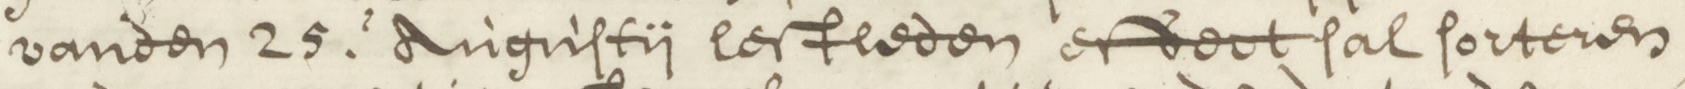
vanden 25e. Augustij lestleden effect sal sorteren,
